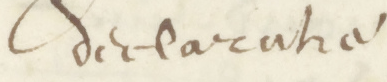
declaratie
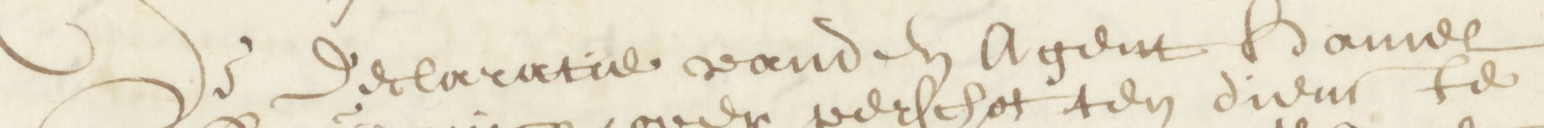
De Declaratie vanden Agent Hamel
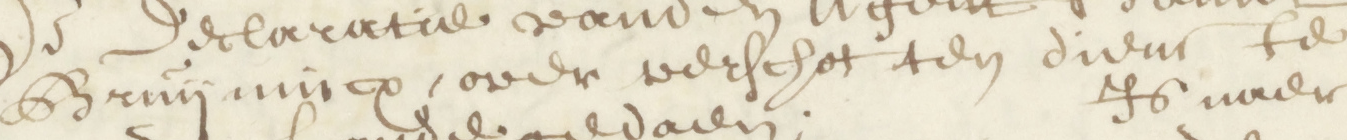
Bruijnincx, over verschot ten dienste
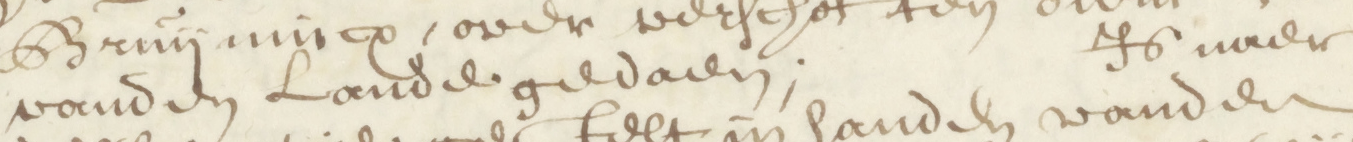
vanden Lande gedaen; Is naer
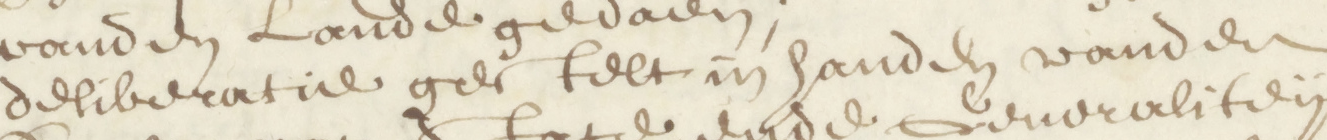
deliberatie gestelt in handen vanden
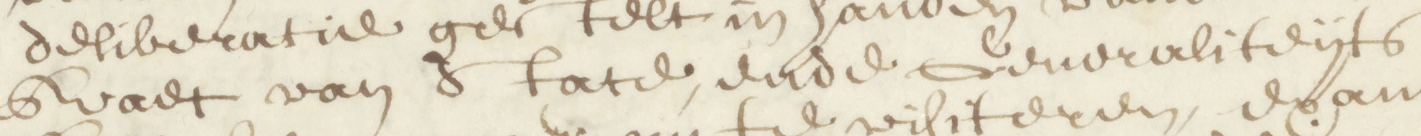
Raet van State, ende Generaliteijts
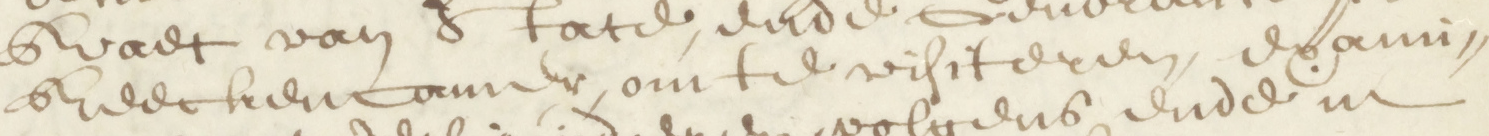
Reeckencamer, om te visiteren, exami„
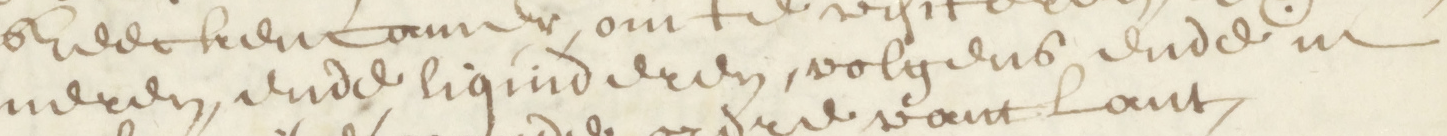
neren, ende liquideren, volgens ende in
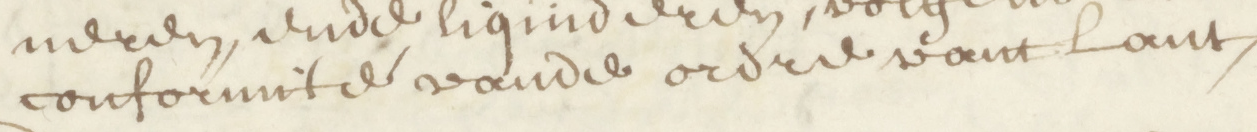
conformité vande ordre vant Lant.
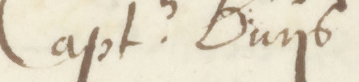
Captn. Buijs
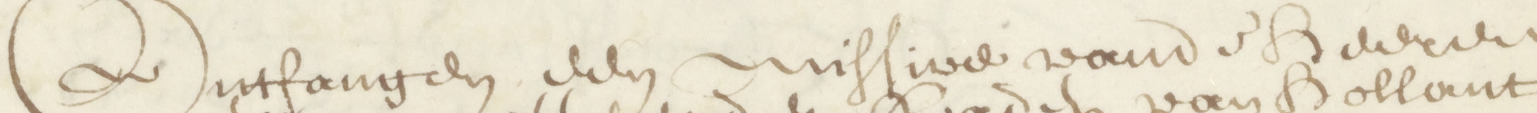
Ontfangen, een Missive vande Heeren
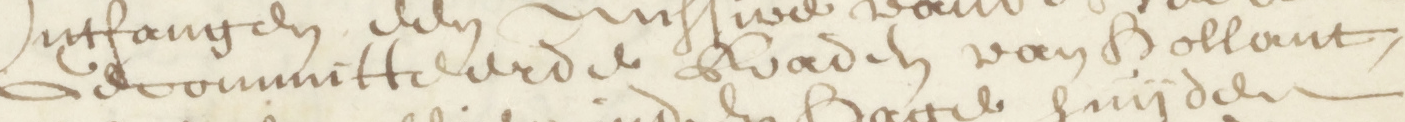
Gecommitteerde Raden van Hollant,
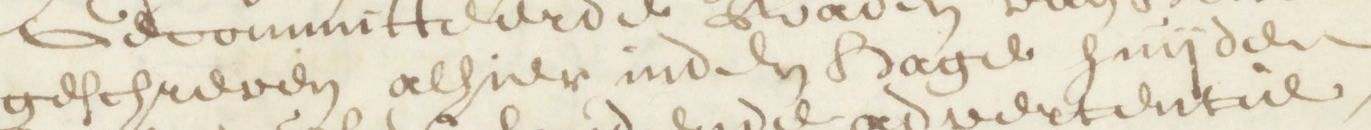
geschreven alhier inden Hage huijden
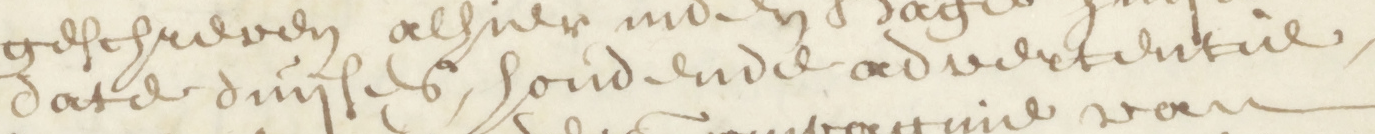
date duijses, houdende advertentie,
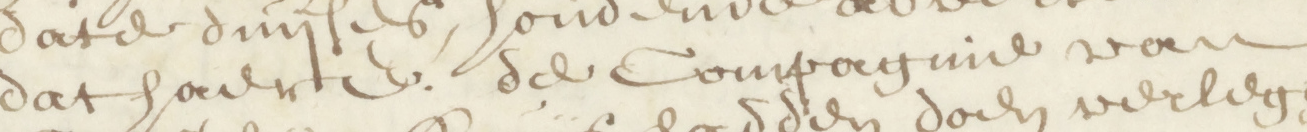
dat haer E. de Compagnie van
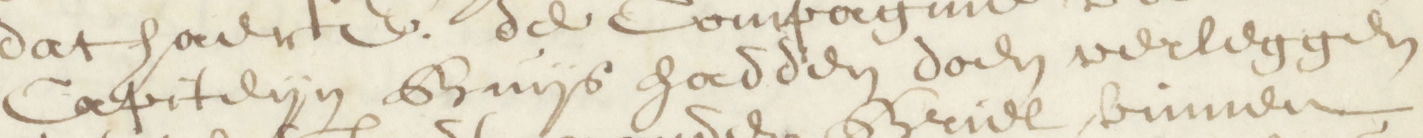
Capiteijn Buijs hadden doen verleggen
